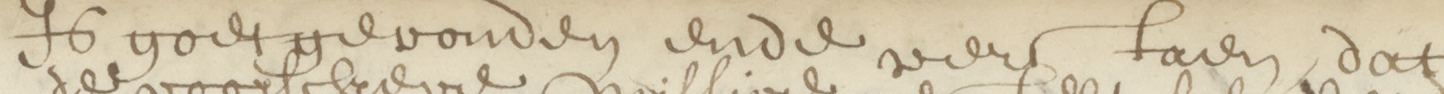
Is goetgevonden ende verstaen, dat
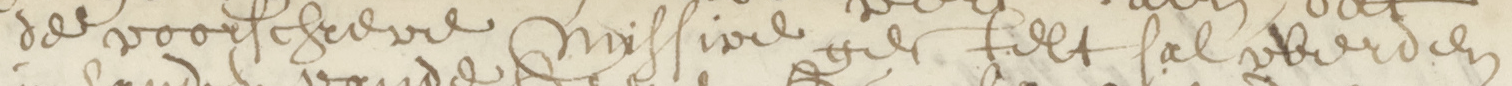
de voorschreve missive gestelt sal werden
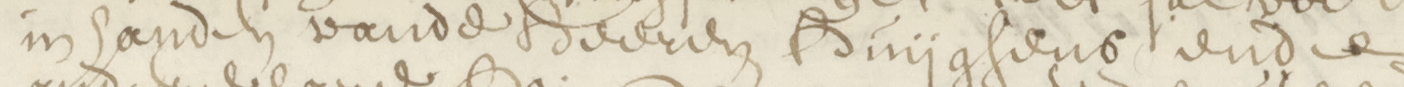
in handen vande Heeren Huijghens ende
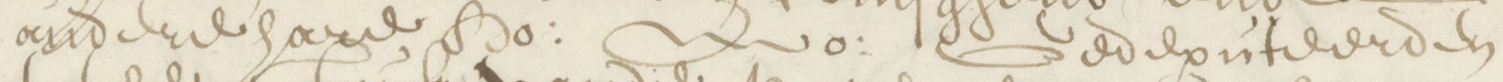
andere hare Ho:Mo: Gedeputeerden
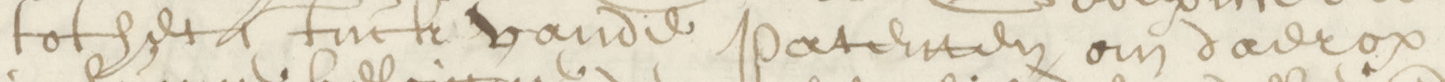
tot het stuck vande patenten, om daerop
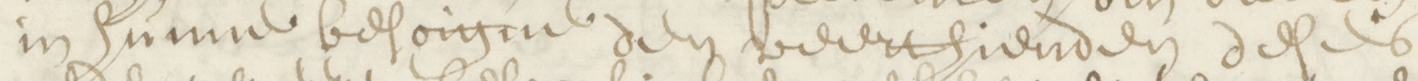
in hunne besoigne den veerthienden deses
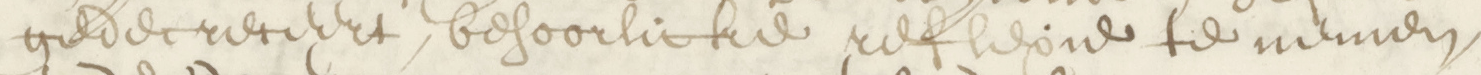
gedecreteert, behoorlicke reflexie te nemen,
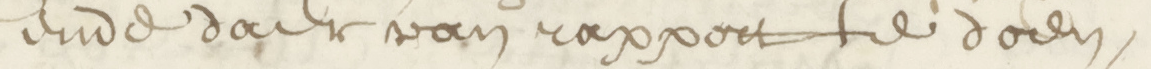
ende daer van rapport te doen.
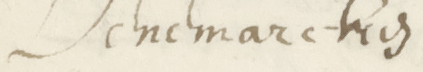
Denemarcken
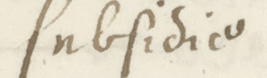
subsidie
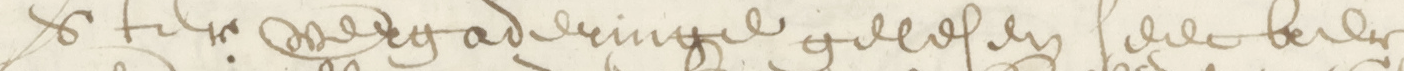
Is ter vergaderinge gelesen seecker
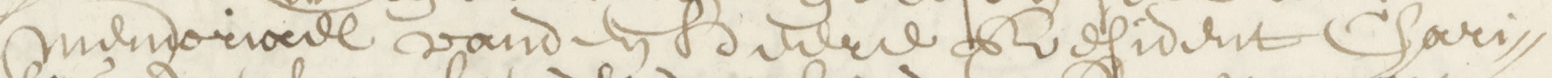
memoriael vanden Heere Resident Chari,,
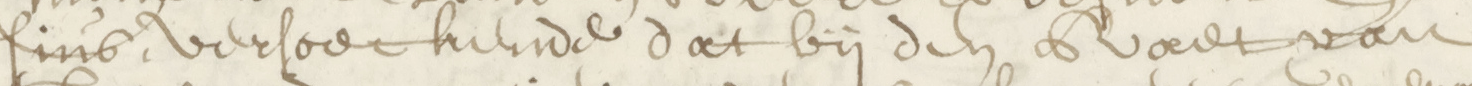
sius, versoeckende dat bij den Raet van
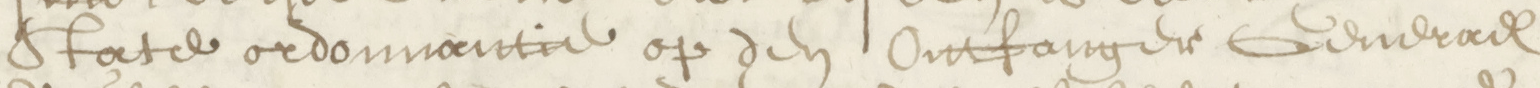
State ordonnantie op den Ontfanger Generael
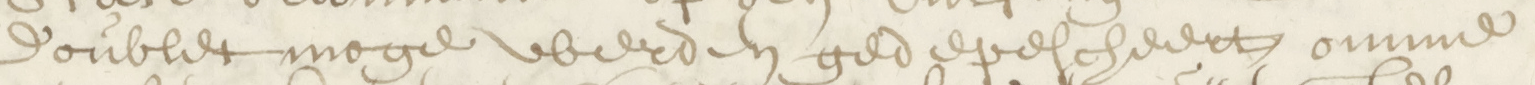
Doublet moge werden gedepescheert, omme
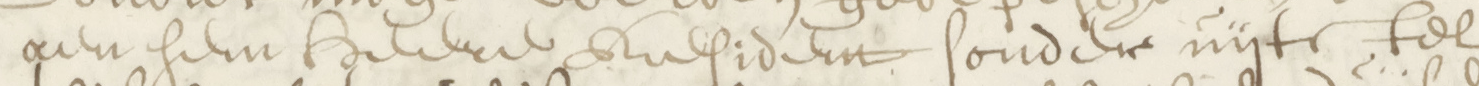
aen hem Heere Resident sonder uijtstel
